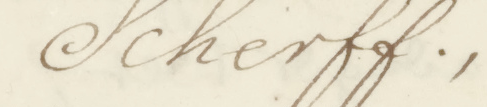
Scherff.
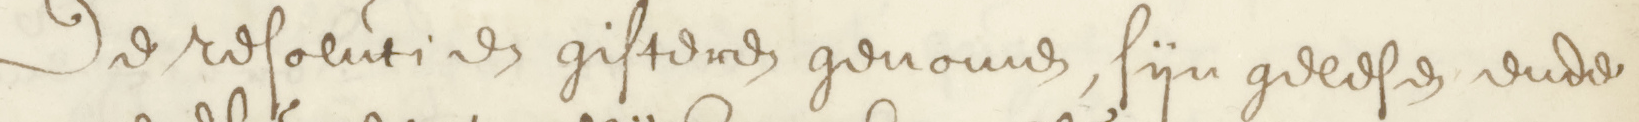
De resolutien gisteren genomen, sijn gelesen ende
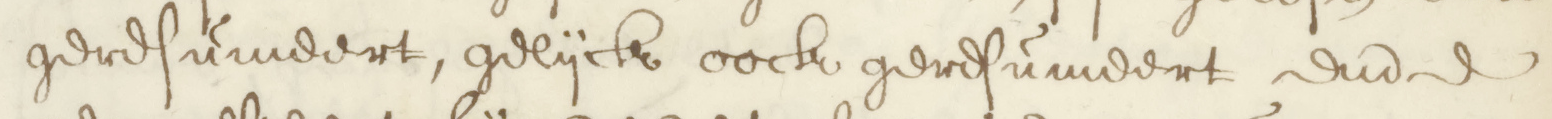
geresumeert, gelijck oock geresumeert ende
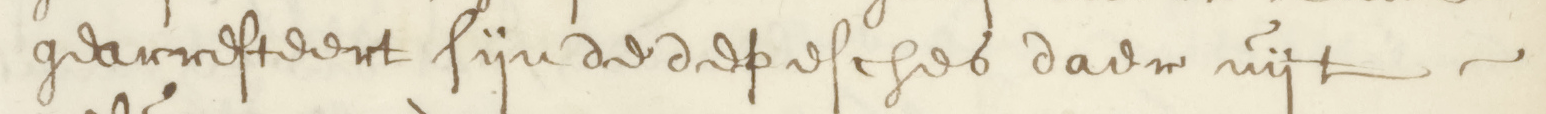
gearresteert sijn de depesches daer uijt
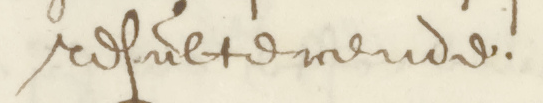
resulterende.
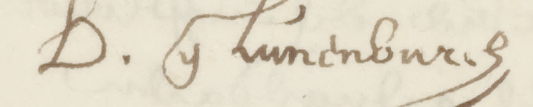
B. & Lunenburch
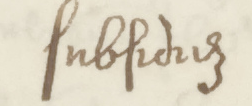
subsidien
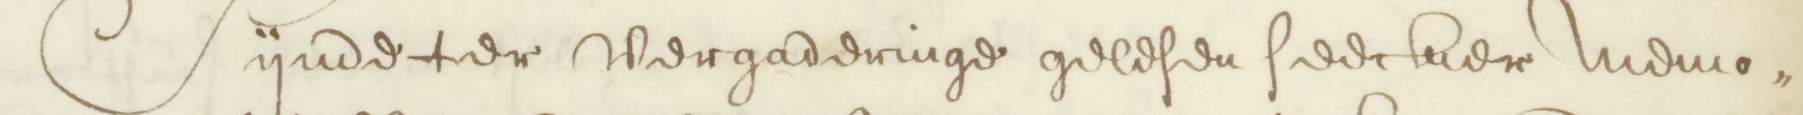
Sijnde ter vergaderinge gelesen seecker memo„
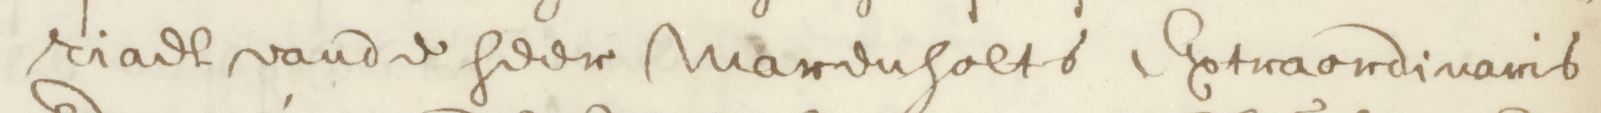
riael vande heer Marenholts Extraordinaris
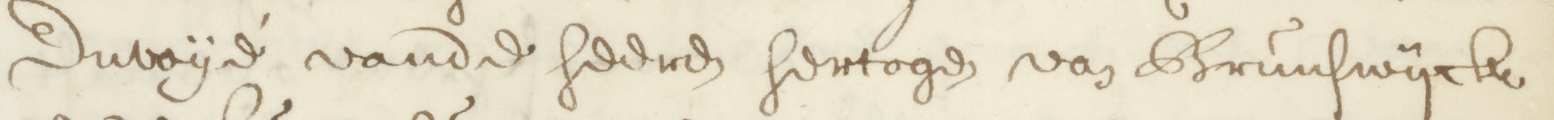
Envoijé vande heeren hertoge van Brunswijck
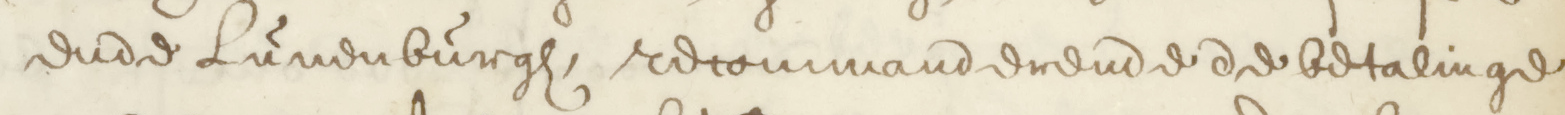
ende Lunenburgh, recommanderende de betalinge
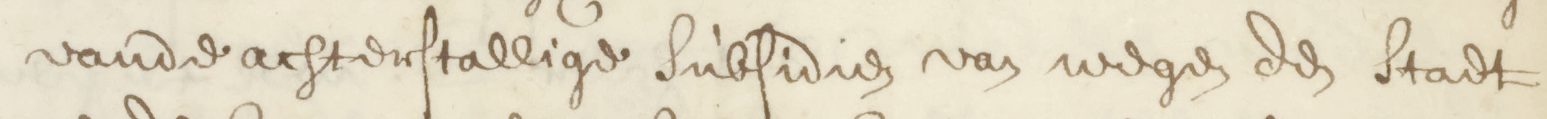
vande achterstallige subsidien van wegen den stadt
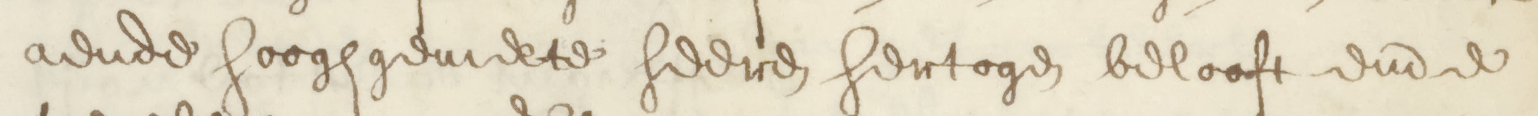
aende hooghgemelte heeren hertogen belooft ende
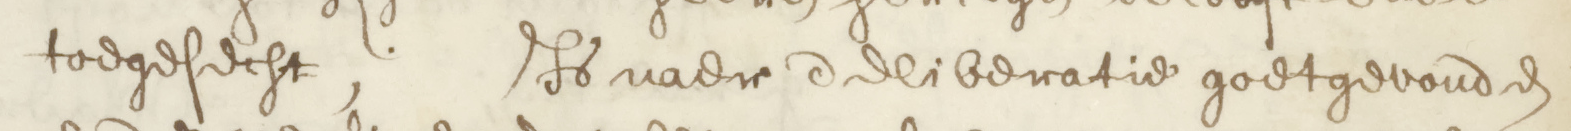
toegesecht. Is naer deliberatie goetgevonden
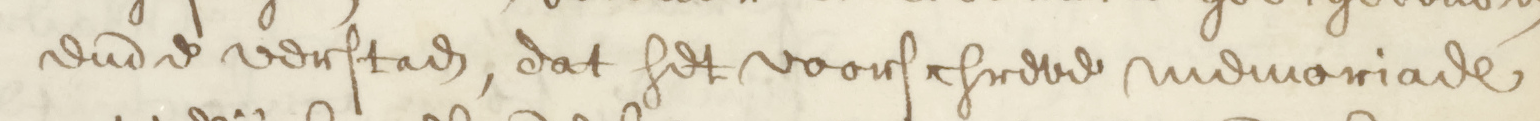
ende verstaen, dat het voorschreve memoriael
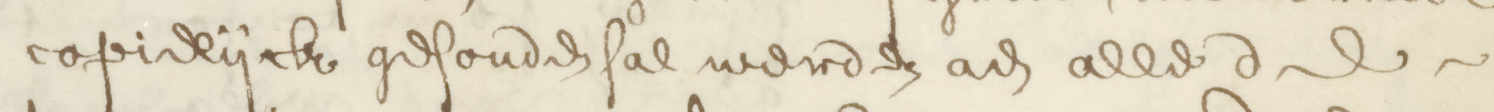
copielijck gesonde sal werden aen alle de
